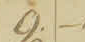9.
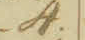4.
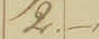2.
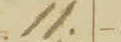11.
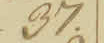37.
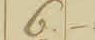6.
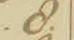8.
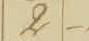2
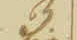3.
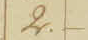2.
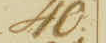40.
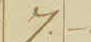7.
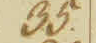35.
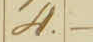4.
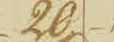20.
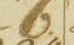6.
